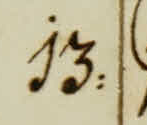13:
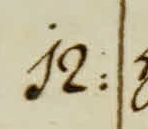12:
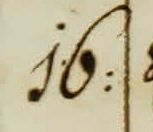16:
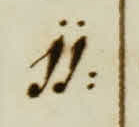11:
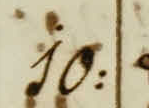10:
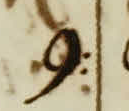9:
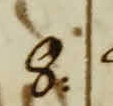8:
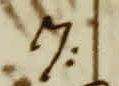7:
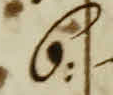6:
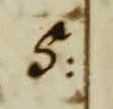5:
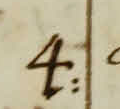4:
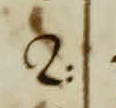2:
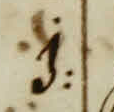1:
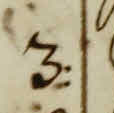3:
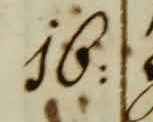16:
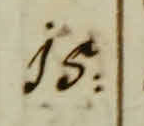15:
